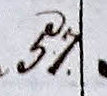57.
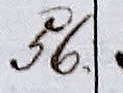56.
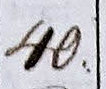40
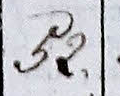52.
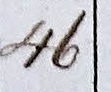46
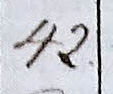42
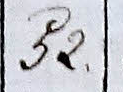52.
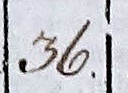36.
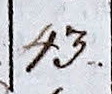43
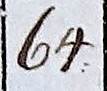64
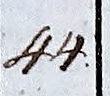44
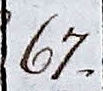67
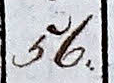56
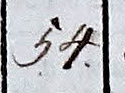54.
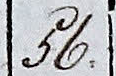56
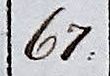67
